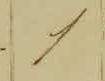1
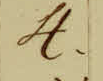4
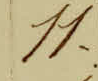11
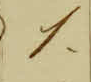1
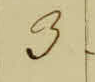3
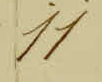11
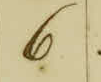6
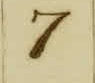7
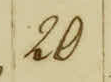20
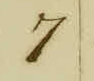7
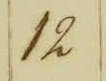12
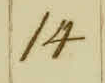14
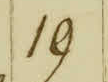19
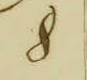8
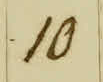10
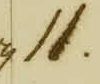11
